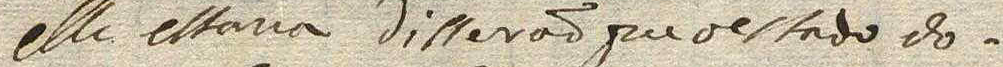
elle estaua disseraõ que o estado do
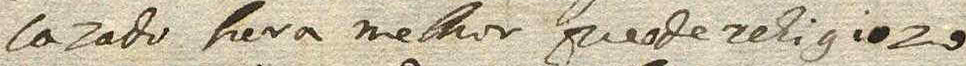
cazado hera melhor que o de religiozo
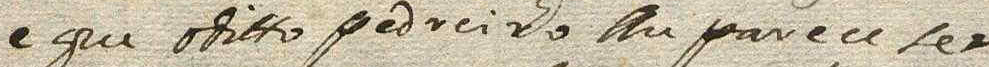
e que o ditto pedreiro lhe pareçe ser
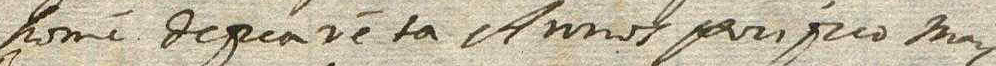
homē de quarēta Annos pouquo mais
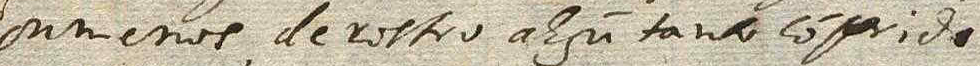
ou menos de rostro algū tanto cōprido
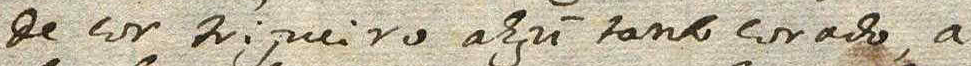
de cor trigueiro algū tanto corado, a
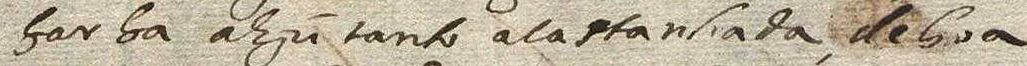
barba algū tanto acastanhada, de boa
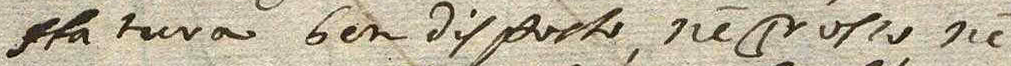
statura bem disposto, nē grosso, nē
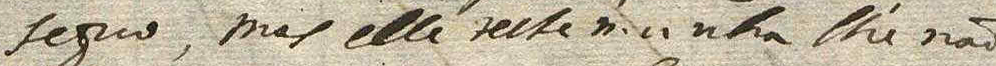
sequo, mas elle testemunha lhe naõ
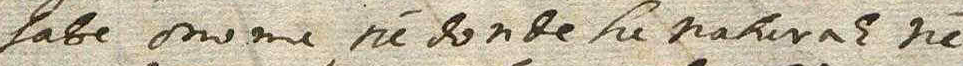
sabe o nome, nē donde he natural nē
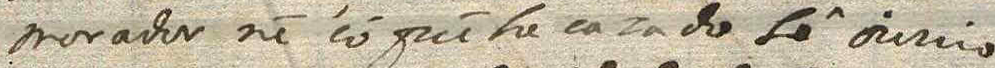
morador nē cō quē he cazado só ouuio
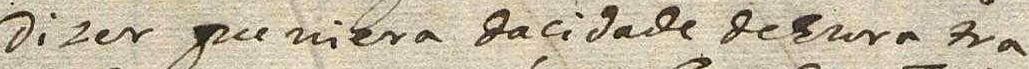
dizer que uiera da çidade de Euora tra
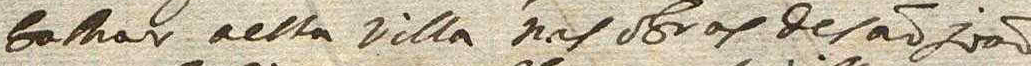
balhar a esta villa nas obras de saõ joaõ
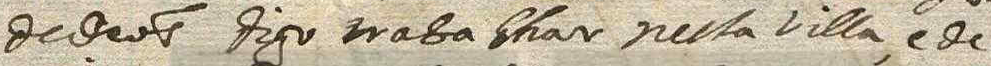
de deos digo trabalhar nesta villa, e de
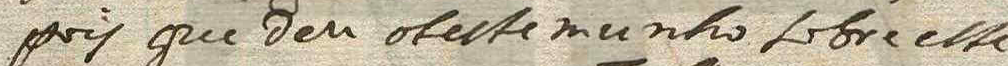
pois que deu o testemunho sobre este
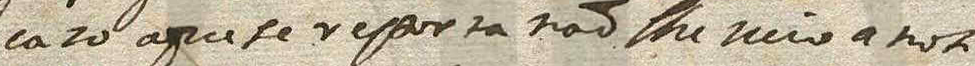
cazo a que se reporta naõ lhe ueio a noti
